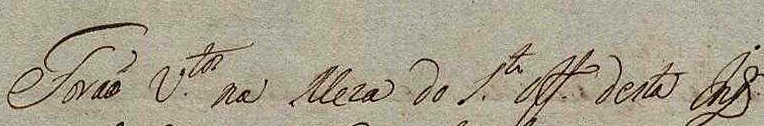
Foraõ V.tos na Meza do s.to off.o desta Inq.o
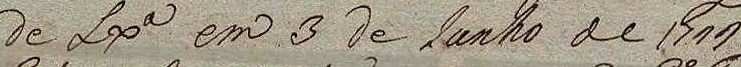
de Lxa em 3 de Iunho de 1799 ā
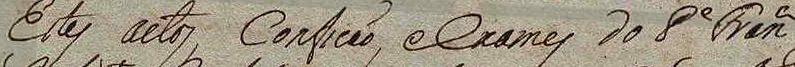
Estes actos, Conficaõ, e Exames do P.e Fran.co
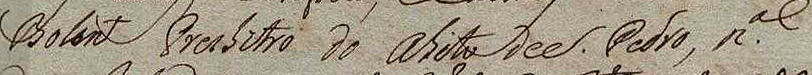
Bolant Presbitro do abito de S. Pedro, n.al
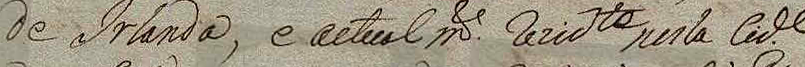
de Irlanda, e actualm.te Rezid.te nesta Cid.e
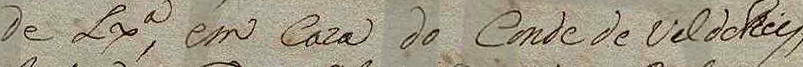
de Lxa, em Caza do Conde de Val de Reis,
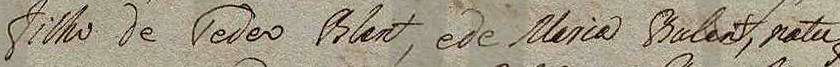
filho de Tedeo Blant, e de Maria Bulant, natu
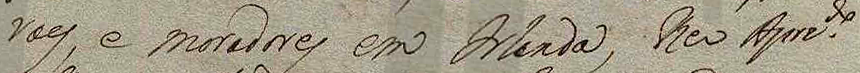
raes, e moradores em Irlanda, Reo Apre.do
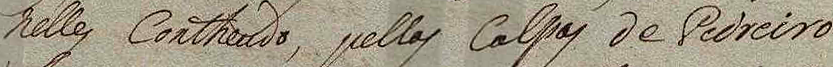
nelles Contheudo, pellas Culpas de Pedreiro
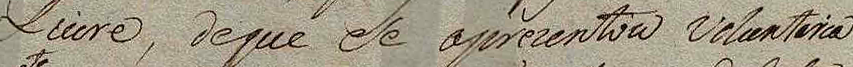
Livre, de que se aprezentou Voluntaria
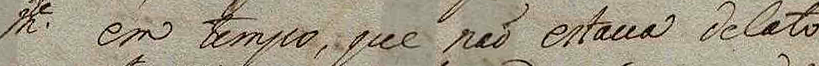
m.te em tempo, que naõ estaua delato
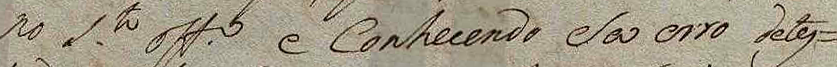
no s.to off.o e Conhecendo seo erro detes
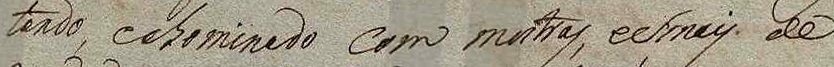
tando, e abominado com mostras, e sinais de
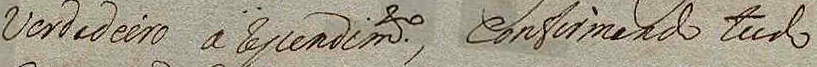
Verdadeiro aRependim.to, confirmando tudo
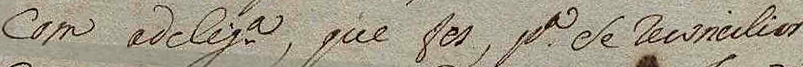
Com a delig.a, que fes, p.a se Reconciliar
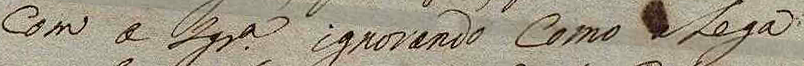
Com a Igr.a ignorando Como aLega
